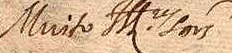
Muito Il̄l.res snrs̄
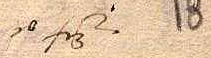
ro frz̄
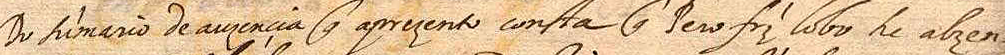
Do sum̄ario de auzencia q̄ aprezento consta q̄ Pero frz̄ lobo he abzen
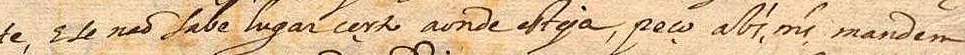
te, E se naõ sabe lugar certo aonde esteja, peço a vs̄. ms̄. mandem
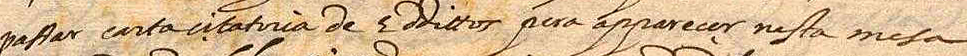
passar carta citatoria de Eddittos pera apparecer nesta mesa
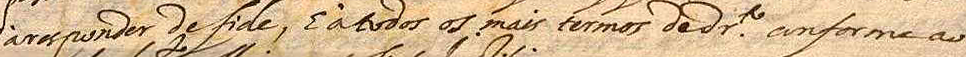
a responder de fide, E a todos os mais termos de dr.to conforme ao
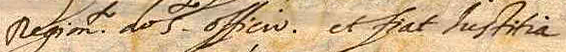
Regim.to do sto. officio. et fiat Iustitia.
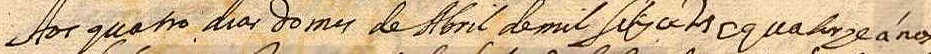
Aos quatro dias do mes de Abril de mil seiscētos E quatorze an̄os
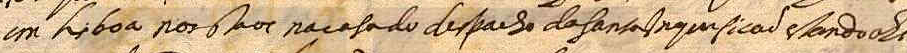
em Lisboa nos staos na casa do despacho da santa Inquisiçaõ estando ahi
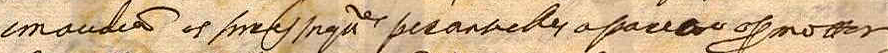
em audiā os snrēs Jnqures perante elles apareceo o ꝓmottor
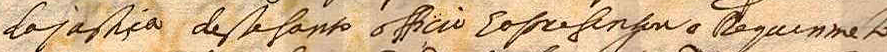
da justiça deste santo officio E apresentou o Requerimēto
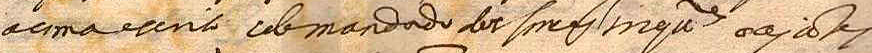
acima escrito E do mandado dos snrēs Inqures o ajuntej
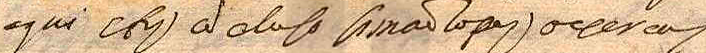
aqui E fiz cōcluso simaõ lopez o escreuj
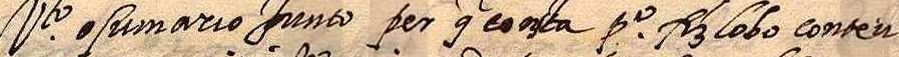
V.to o sumario Junto per q̄ consta p.o frz̄ lobo conteu
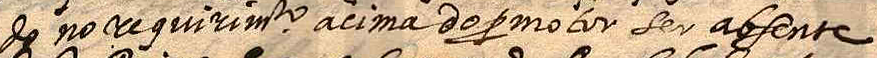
do no requerimto. acima do ꝓmotor ser absente
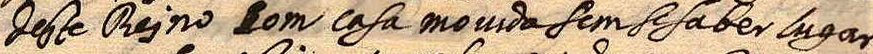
deste Reino com casa mouida sem se saber lugar
